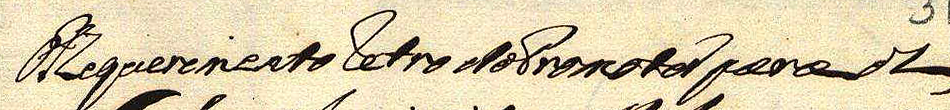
O Requerimento Retro do Promotor para os
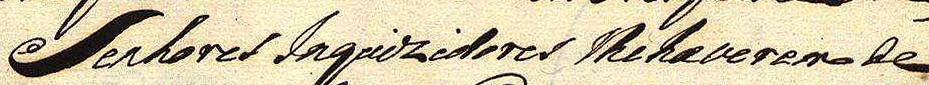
Senhores Inquizidores lhe haverem de
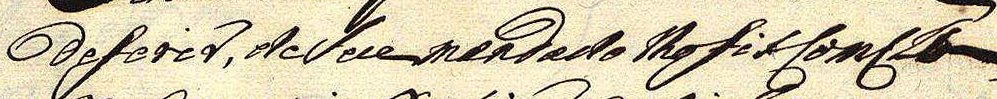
deferir, de Seu mandado lho fiz ComClu
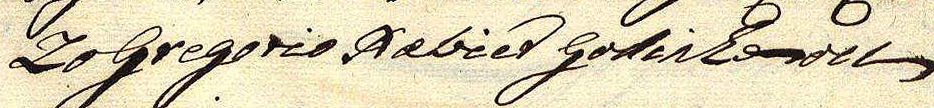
Zo Gregorio Xavier Godinho o es
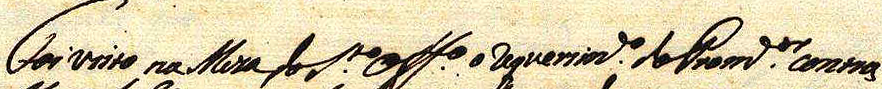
Foi visto na Meza do S.to off.o o Requerim.to do Prom.tor contra
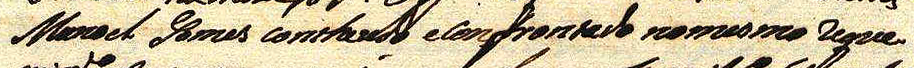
Manoel Gomes contheudo, e confrontado no mesmo Reque
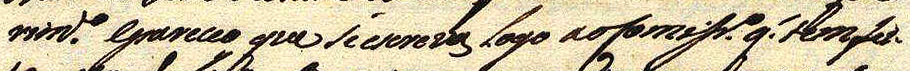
rim.to e pareceo que se escreva logo ao Comisr.o q̄ tem fei
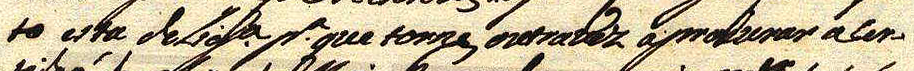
to esta delig.a p.a que torne outra vez a procurar a cer
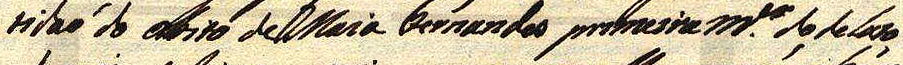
tidaõ do obito de Maia Fernandes primeira m.er do delato,
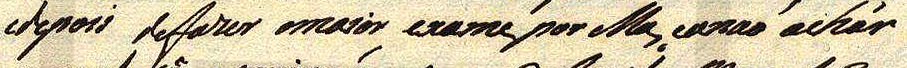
e depois de fazer o maior exame por ella, e o naõ achar
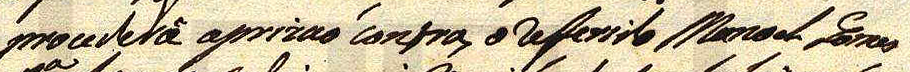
procederá a prizaõ contra o Referido Manoel Gomes
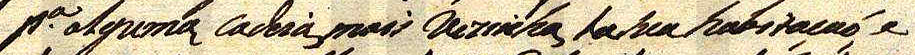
p.a alguma cadeia mais vezinha da sua habitaçaõ, e
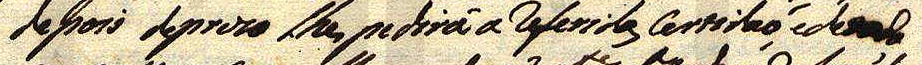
depois de prezo lhe pedirá a Referida certidaõ, e de modo
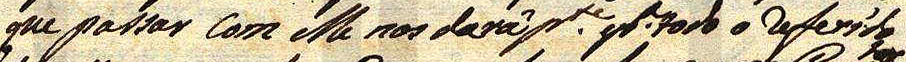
que passar com elle nos dará p.te p.a todo o Referido
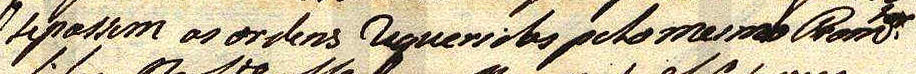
se passem as ordens Requeridas pelo mesmo Prom.tor
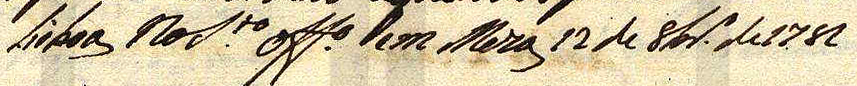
Lisboa no S.to off.o em Meza 12 de 8br.o de 1781
